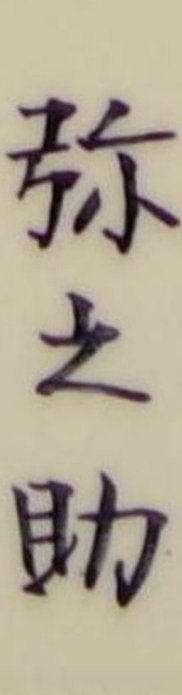弥之助
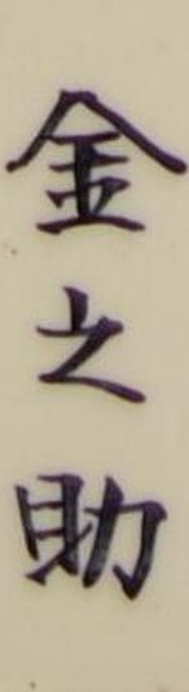金之助
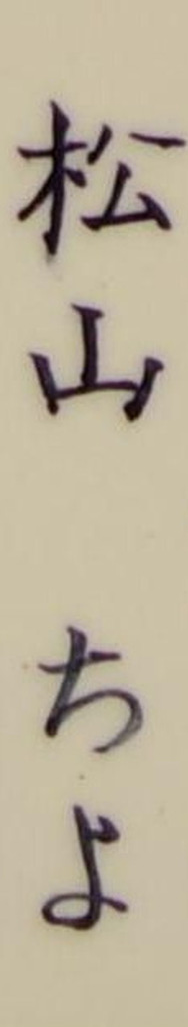松山ちよ
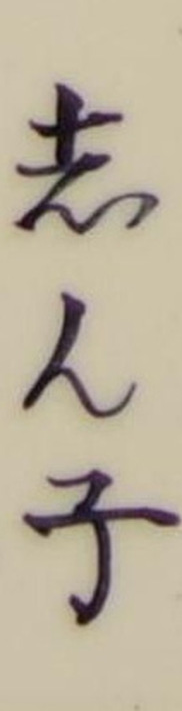しん子
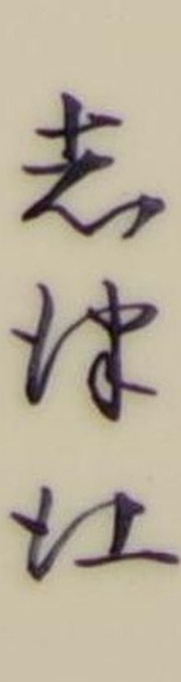しつ江
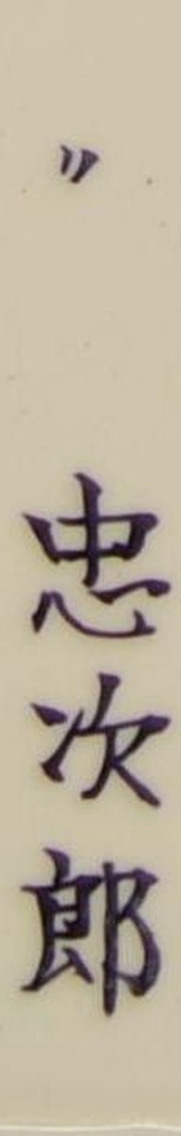忠次郎
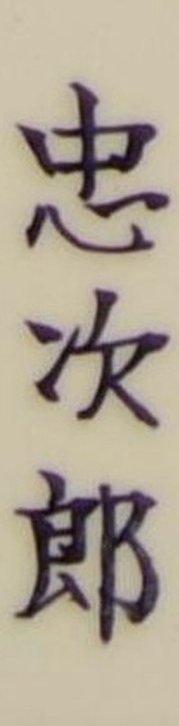忠次郎

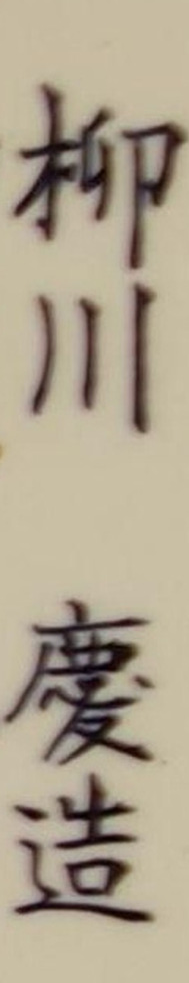柳川慶造
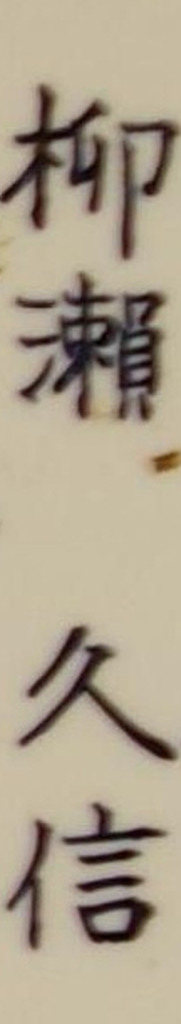柳瀬久信
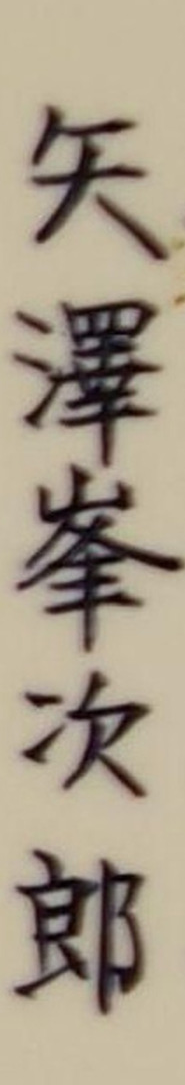矢澤峯次郎
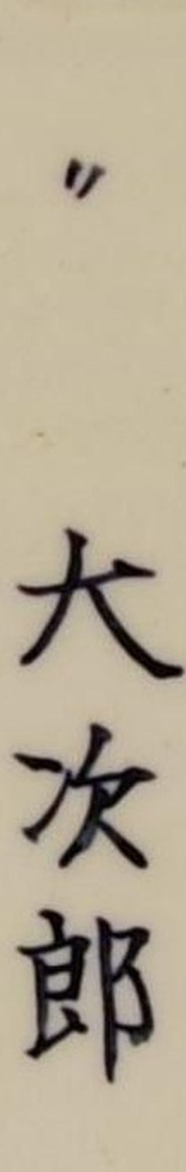大次郎
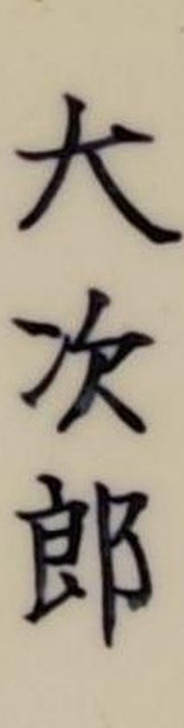大次郎
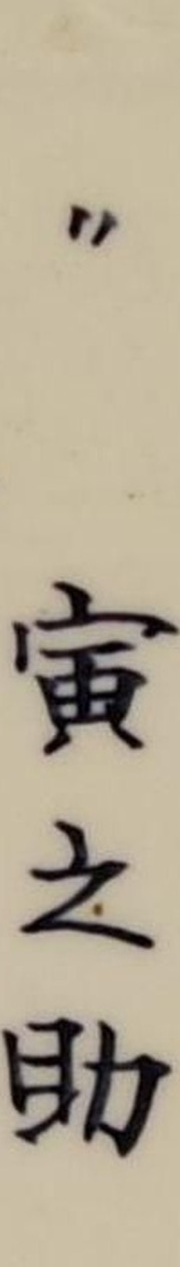寅之助
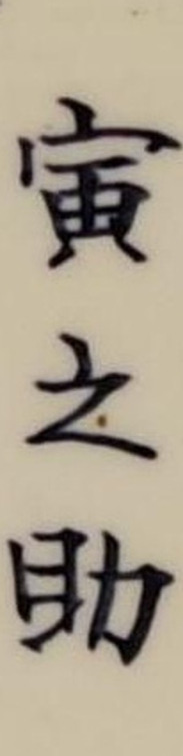寅之助
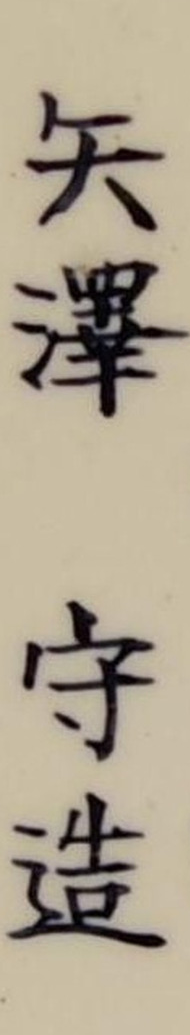矢澤守造
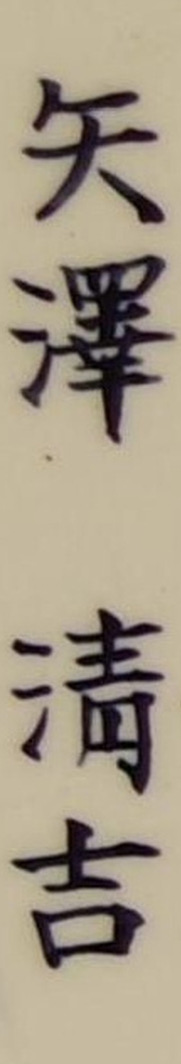矢澤清吉
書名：A~D
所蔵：koyasan kongobuji
